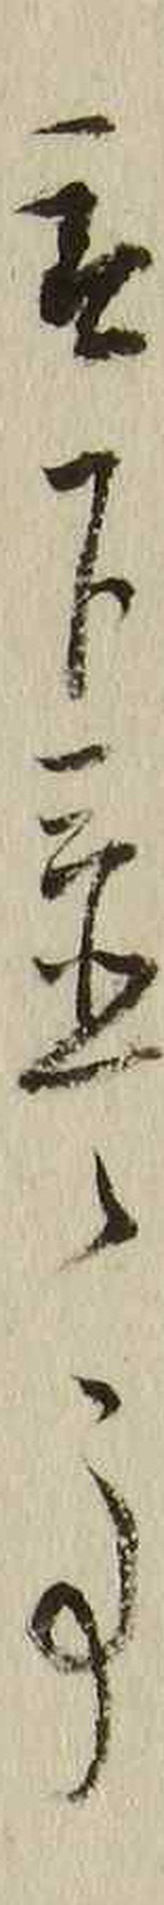被下置候事
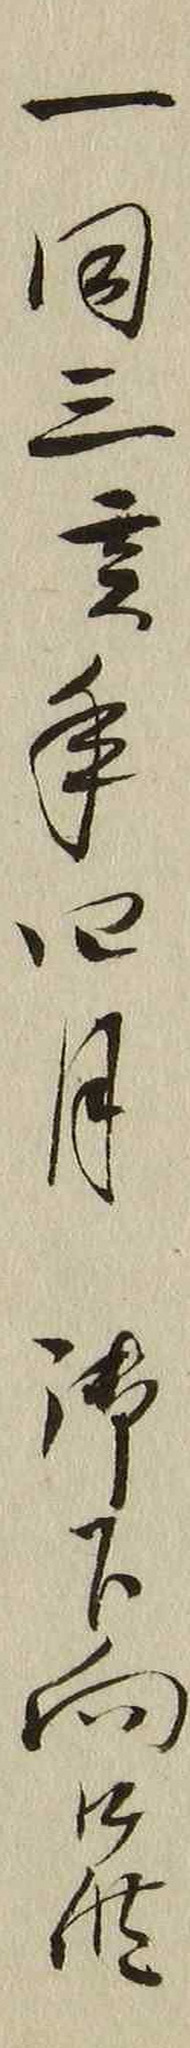一同三亥年四月御下向御供
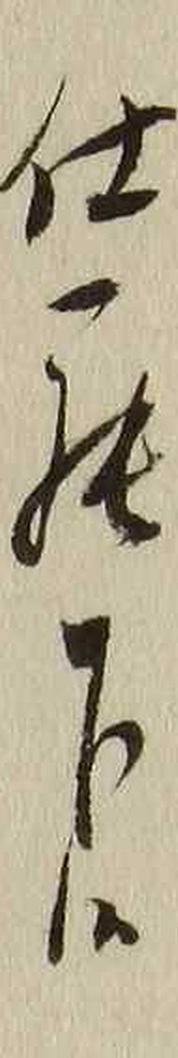仕罷下候
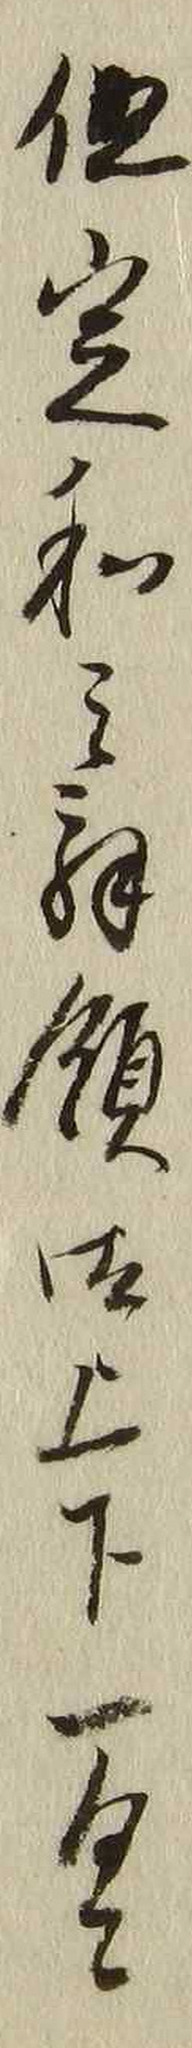但定和之拝領御上下一具
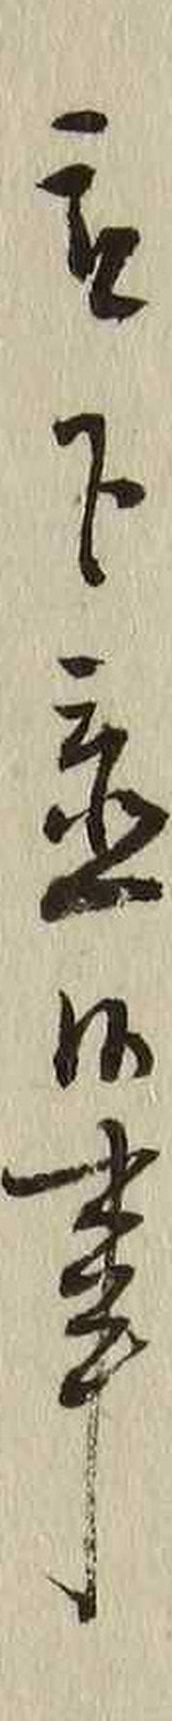被下置候事
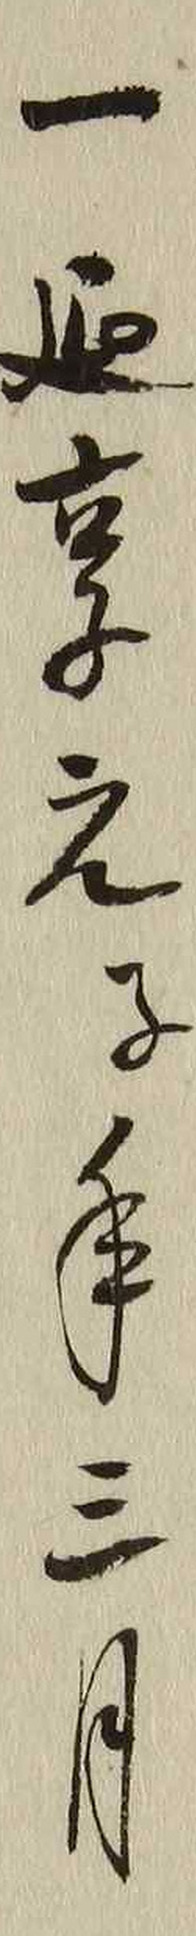一延享元子年三月
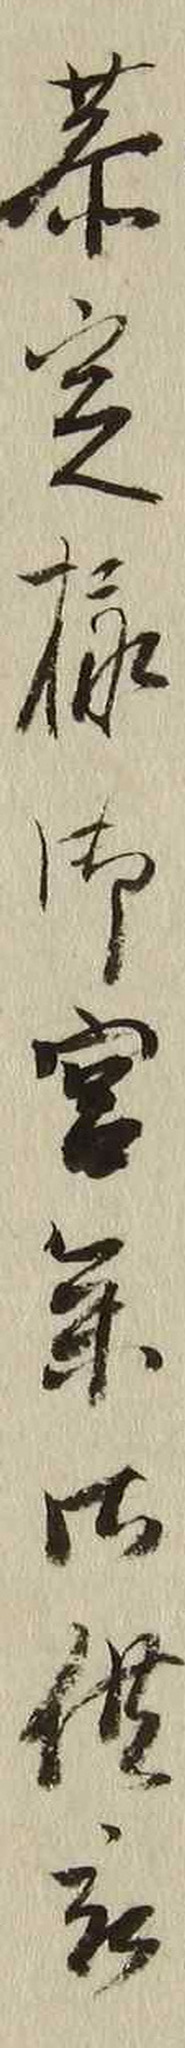恭定様御宮参御供被
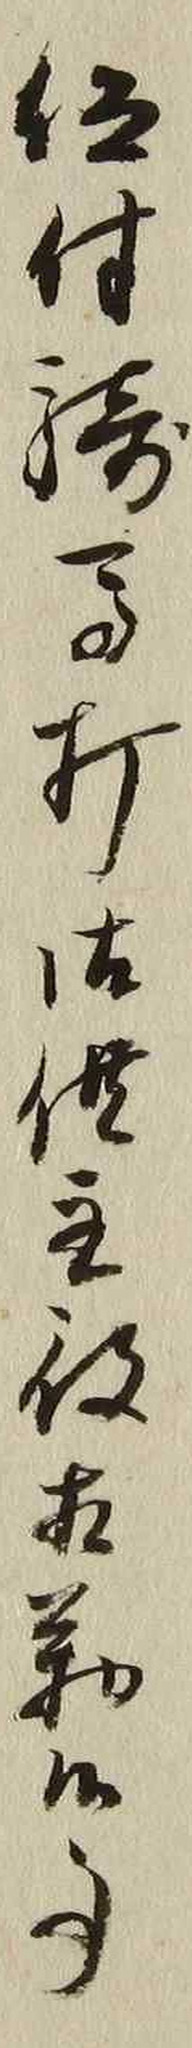仰付綺馬打御供主役相勤候事
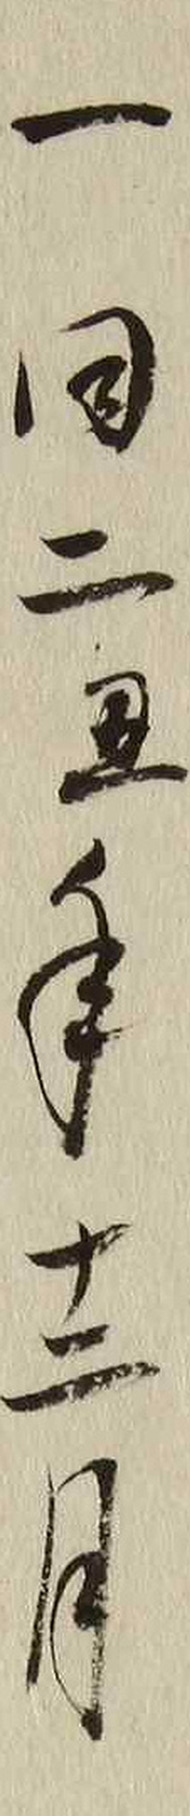一同二丑年十二月
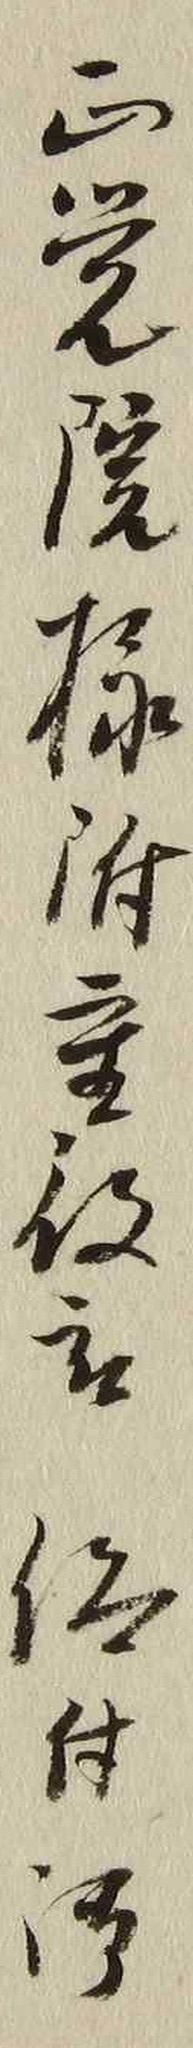正覚院様附重役被仰付御
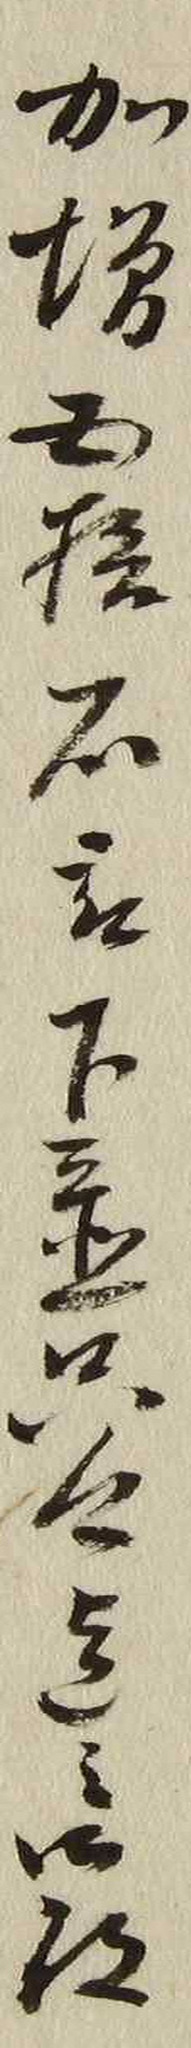加増五拾石被下置只今迄之御役
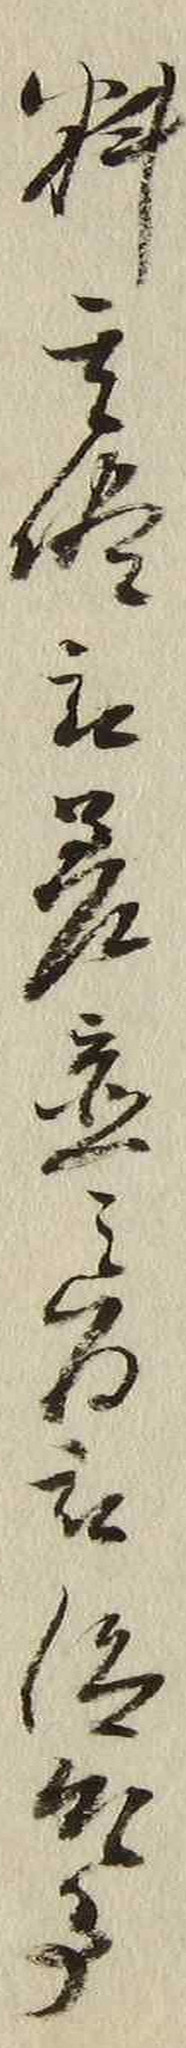料其儘被差置之旨被仰出候事
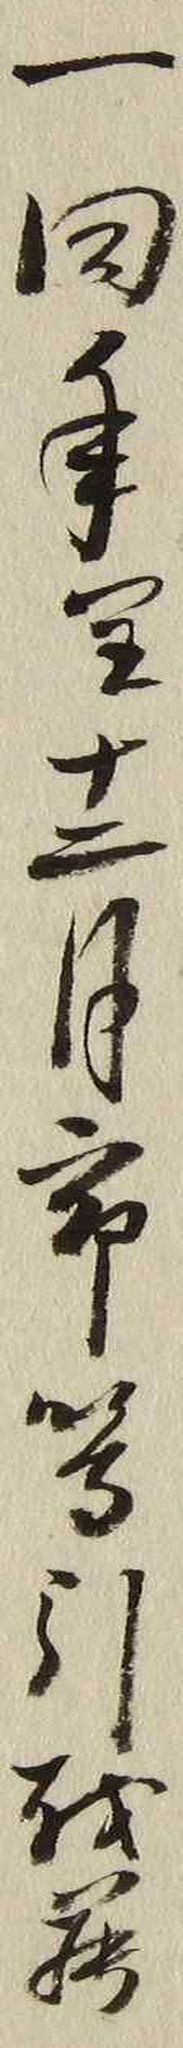一同年閏十二月郎等引越罷
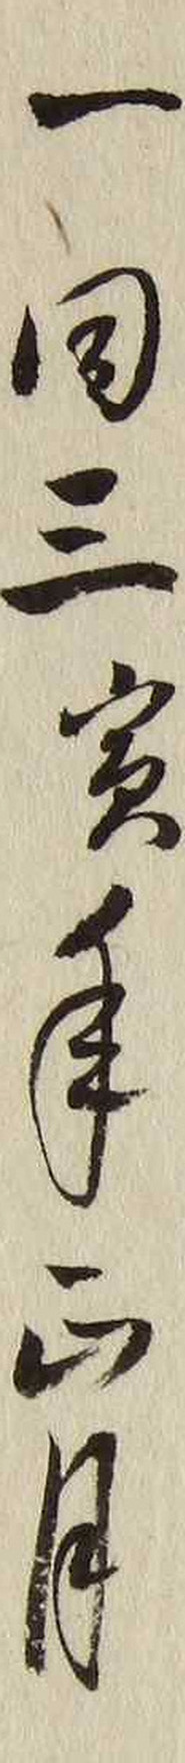一同三寅年正月
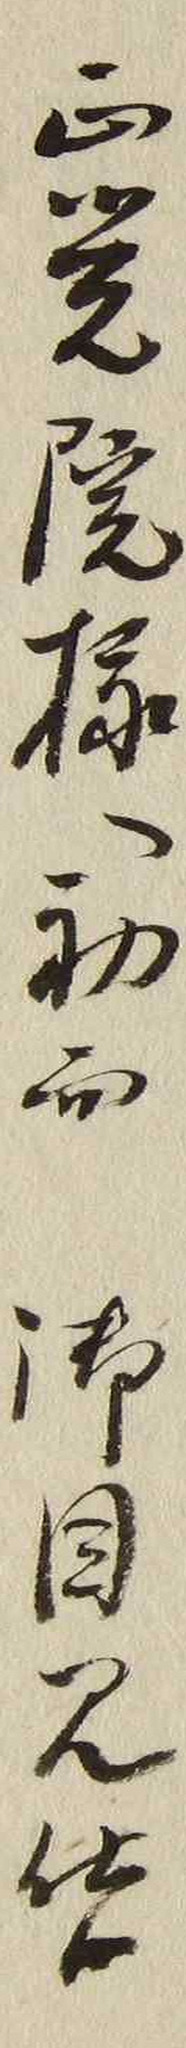正覚院様へ初而御目見仕候
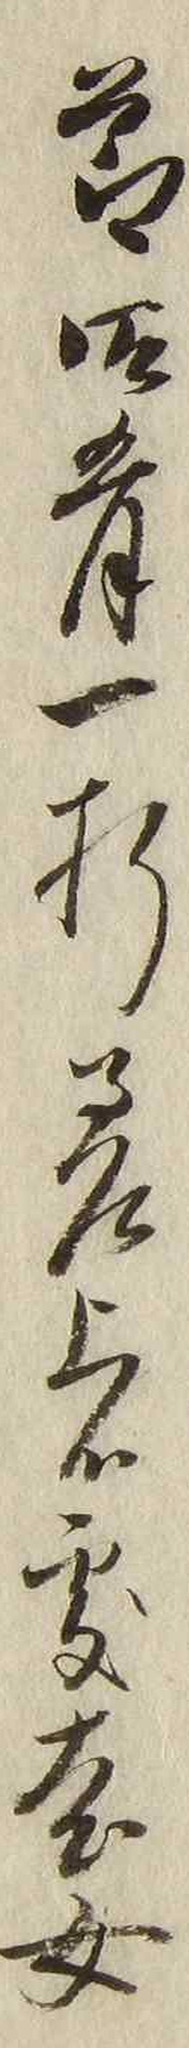節御肴一折差上候処老女
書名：諸士系譜　巻之355　す之部5
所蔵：会津若松市立会津図書館
